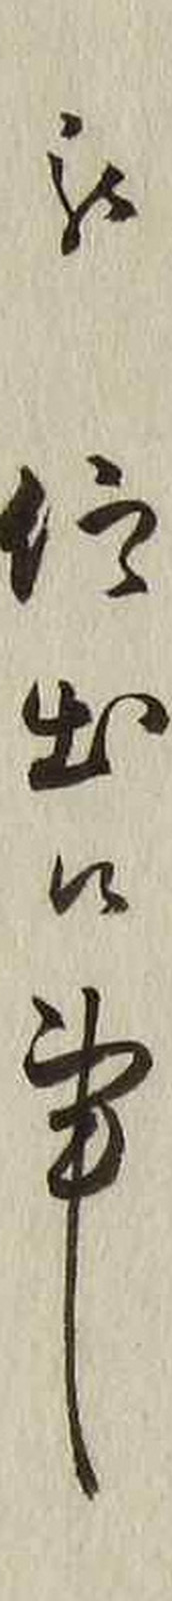被仰出候事
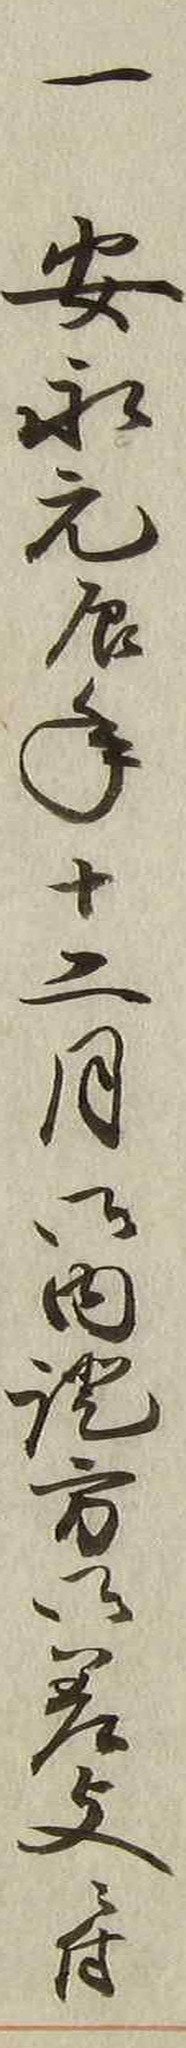一安永元辰年十二月御内証方御差支ニ付
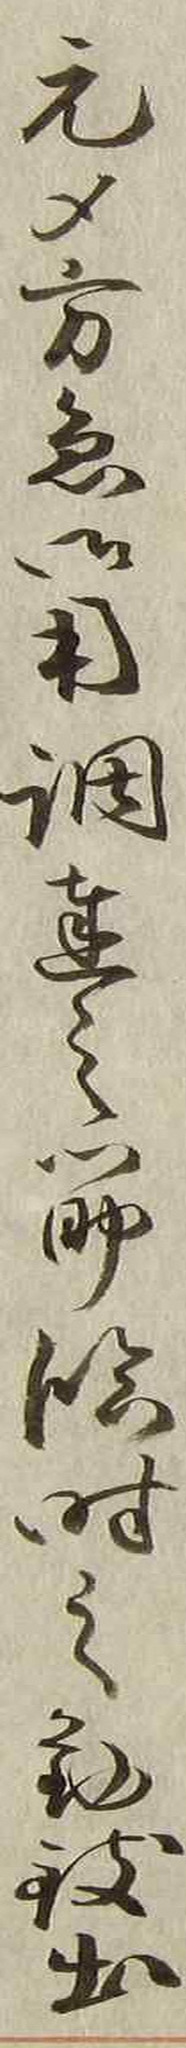元〆方急御用調達之筋臨時之勤致出
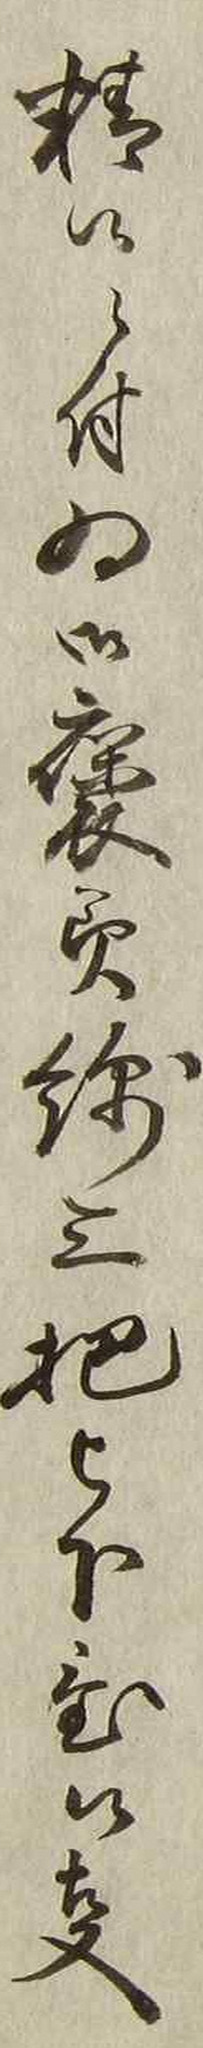精候二付為御褒美綿三把被下置候事
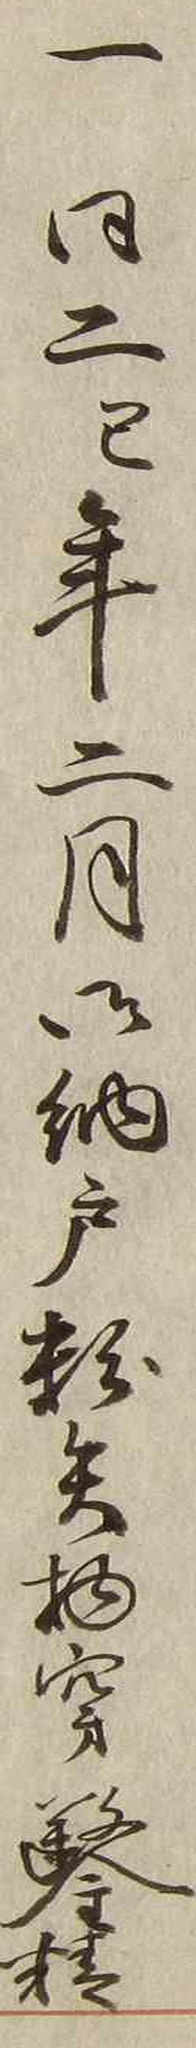一同二巳年二月御納戸粉失物穿鑿精

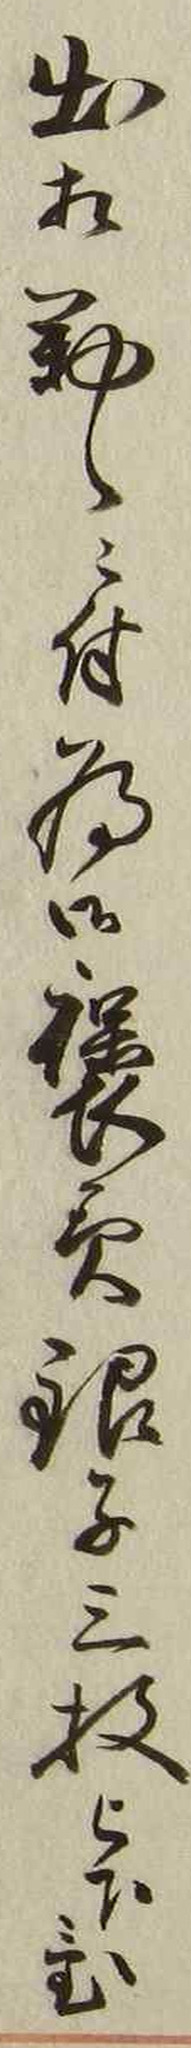出相勤候ニ付為御褒美銀子三枚被下置
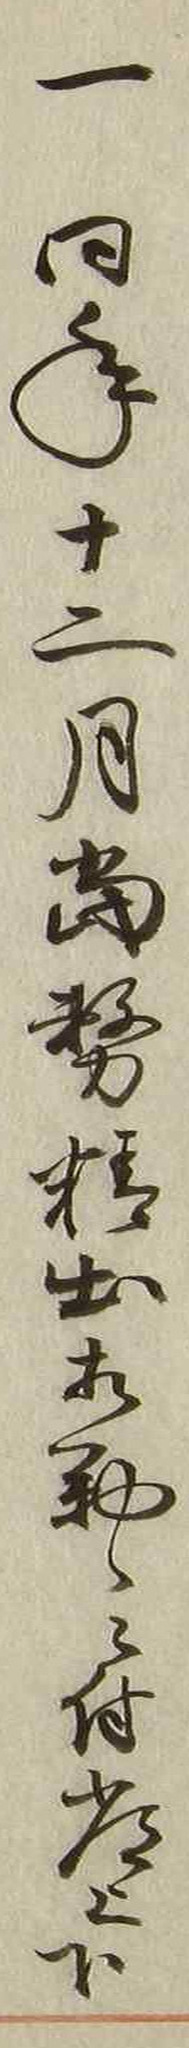一同年十二月当務精出相勤候ニ付常上下
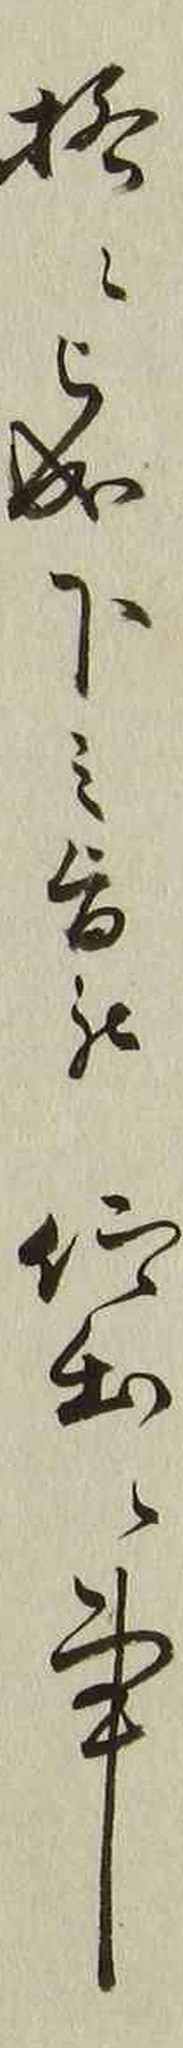格ニ被成下之旨被仰出候事
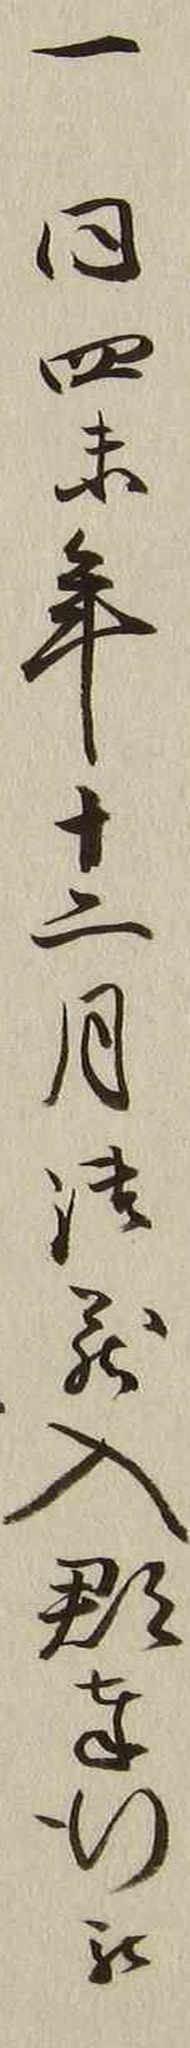一同四未年十二月御蔵入郡奉行被
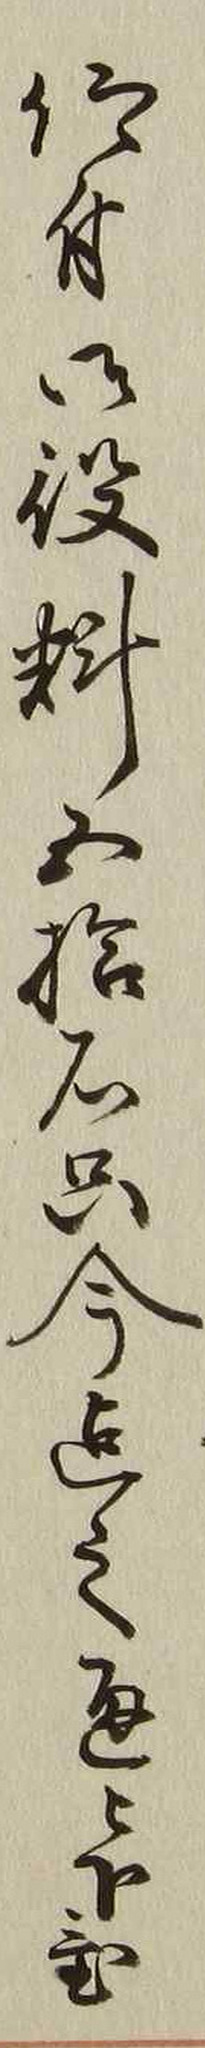仰付御役料五拾石只今迄之通被下置
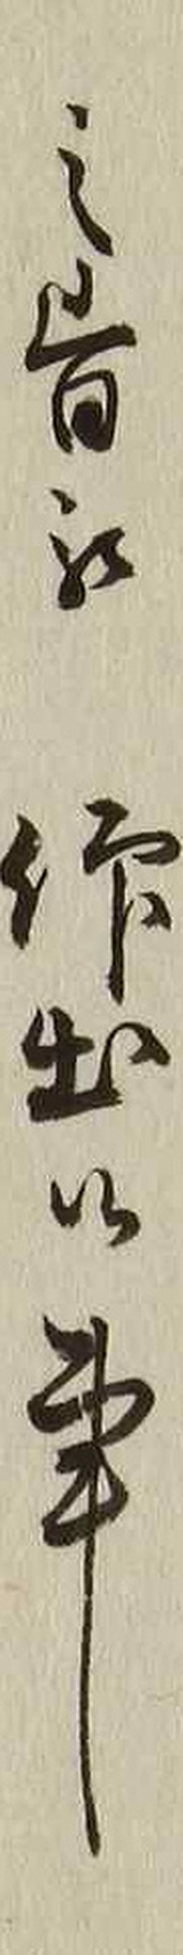之旨被仰出候事
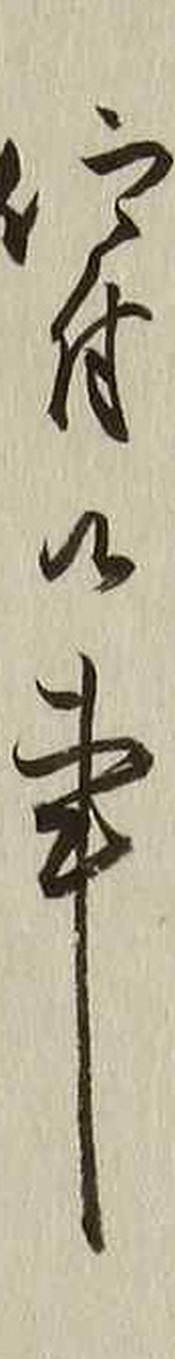仰付候事
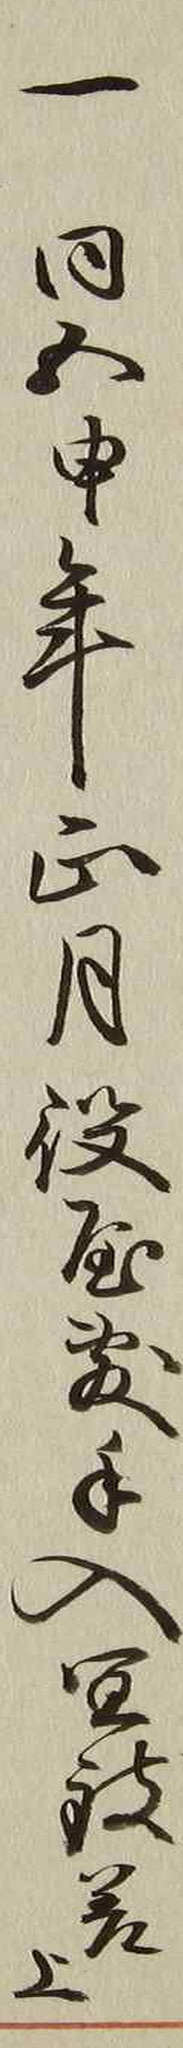一同五申年正月役屋敷手入宜致差上
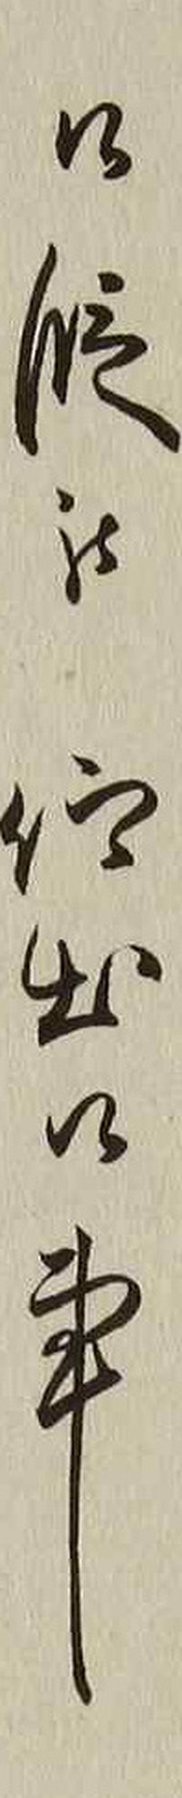候段被仰出候事
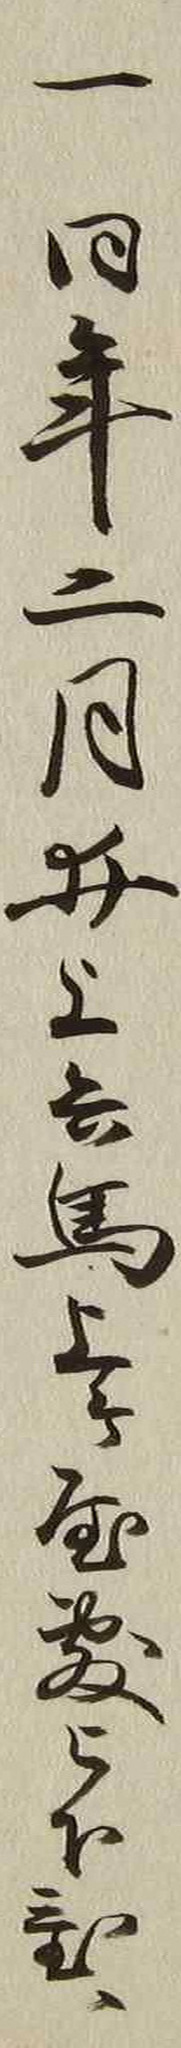一同年二月井上兵馬上ケ屋敷被下置候
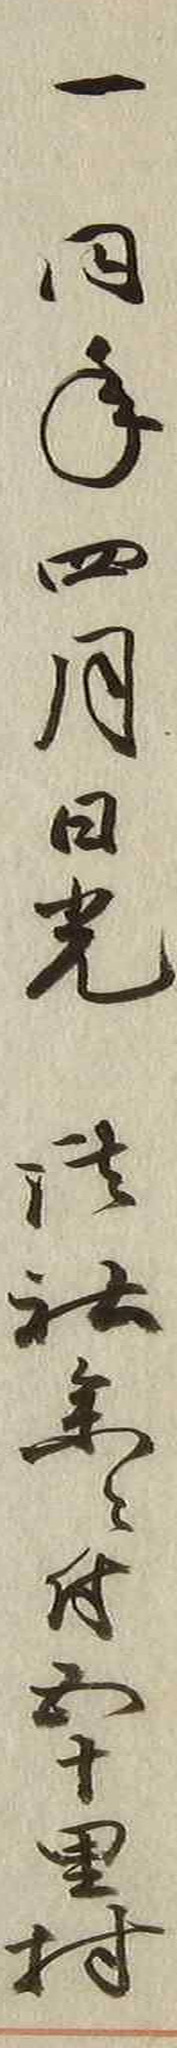一同年四月日光御社参ニ付五十里村
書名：諸士系譜　巻之15　い之部15
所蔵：会津若松市立会津図書館
